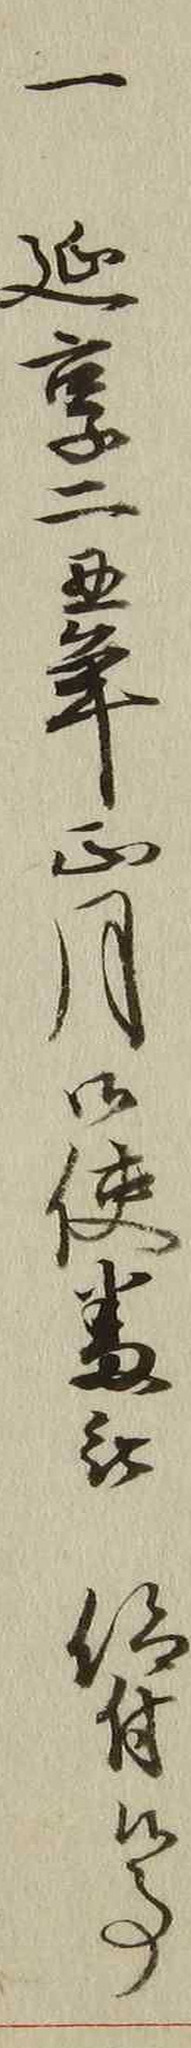一延享ニ丑年正月御使番被仰付候事
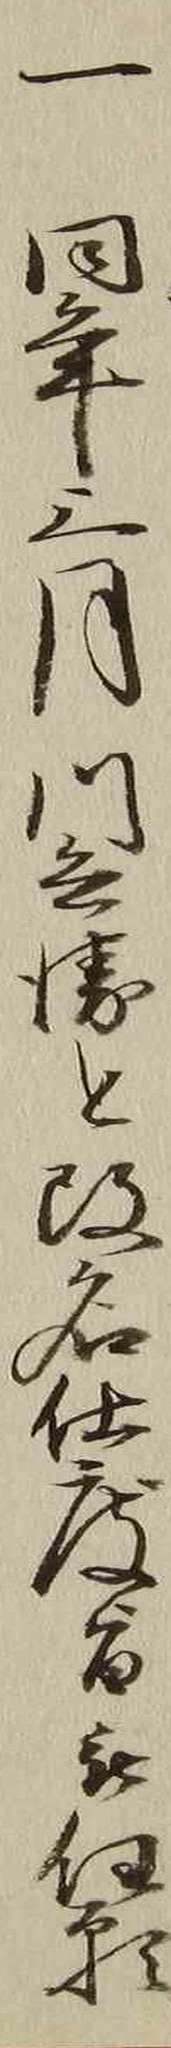一同年三月川兵衛と改名仕度旨被伺願
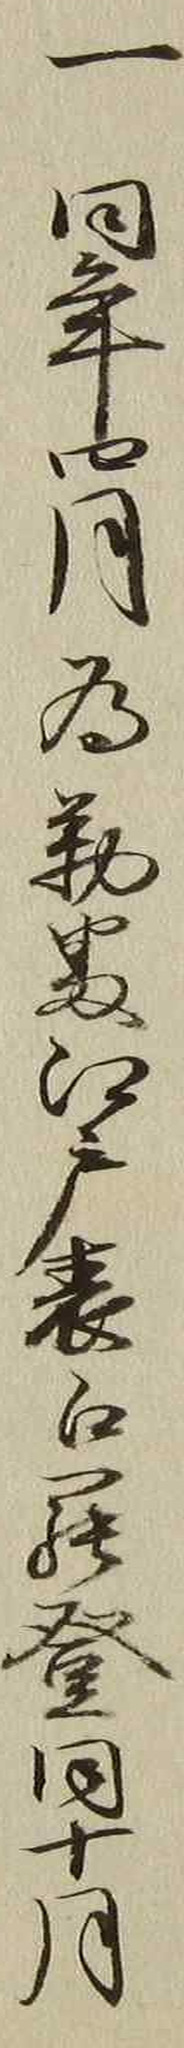一同年四月為勤番江戸表江罷登同十月
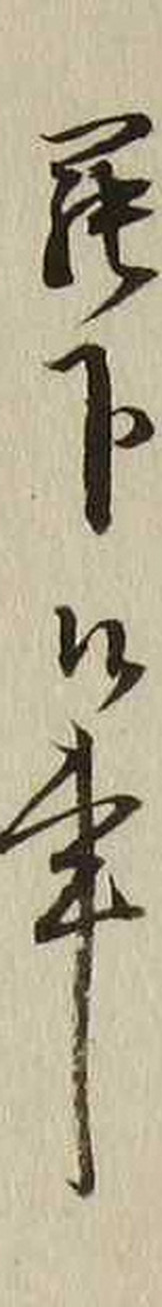罷下候事
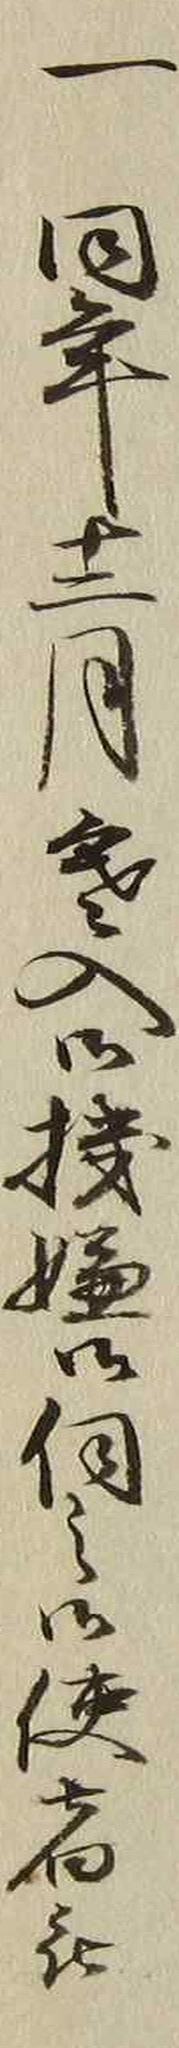一同年十二月寒入御機嫌御伺之御使者被
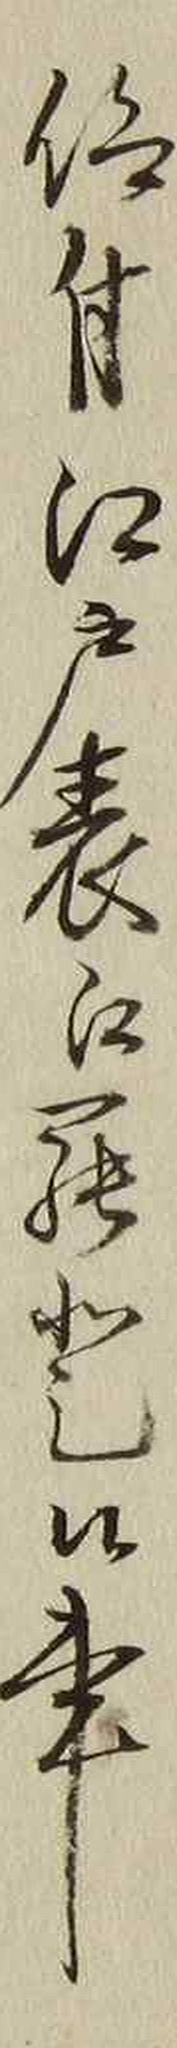仰付江戸表江罷登候事
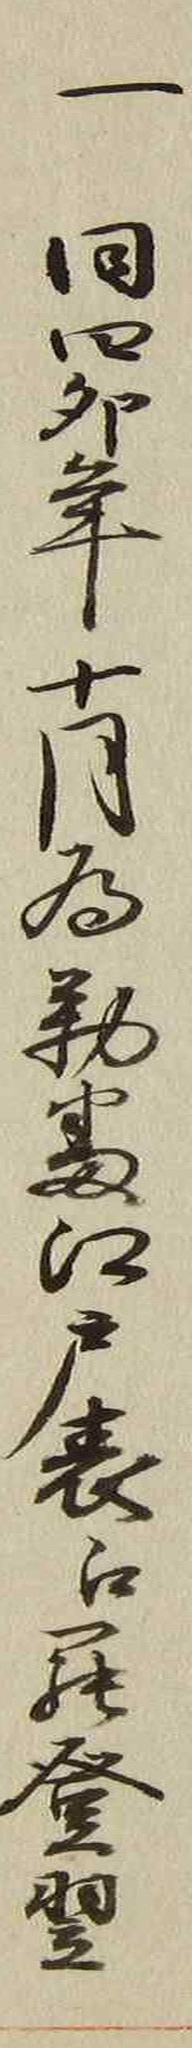一同四夘年十月為勤番江戸表江罷登翌
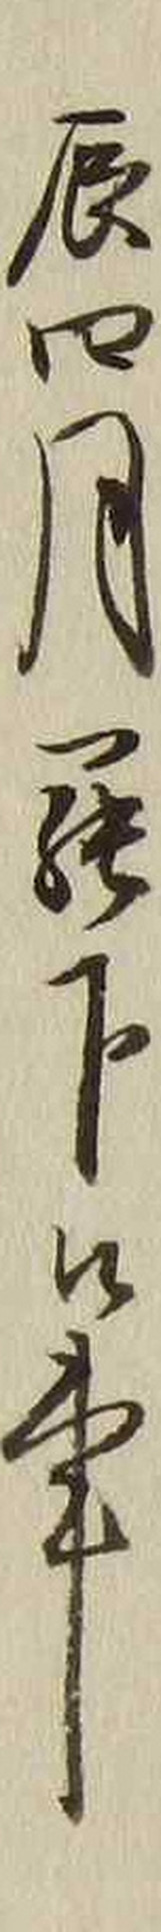辰四月罷下候事
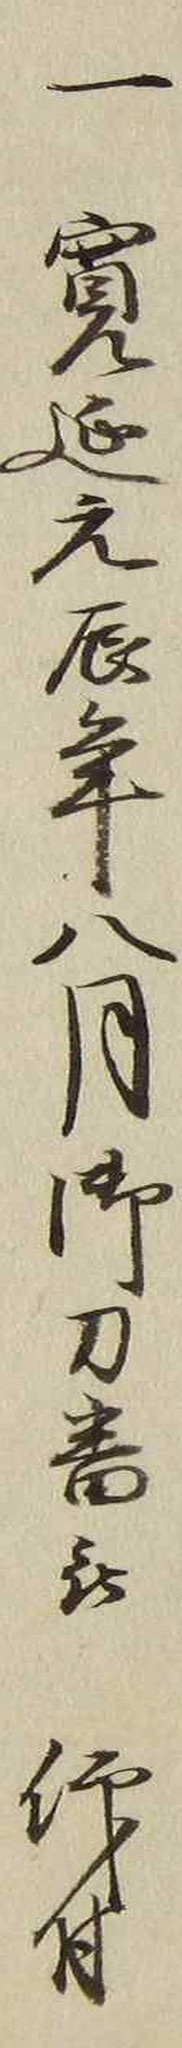一寛延元辰年八月御刀番被仰付
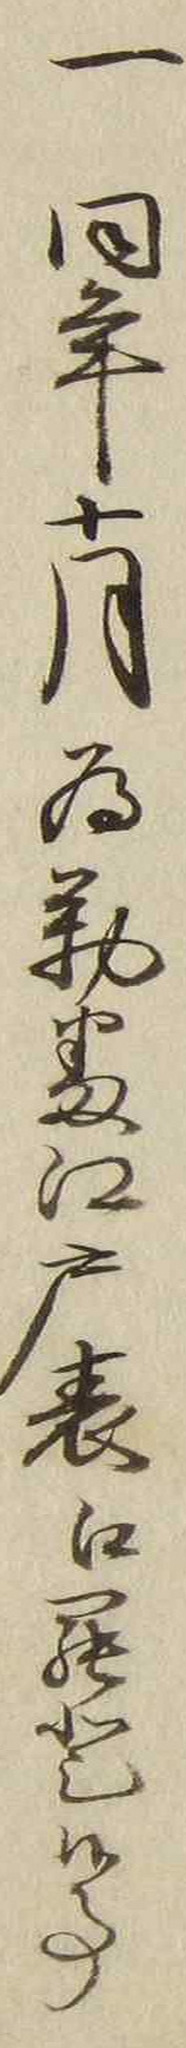一同年十月為勤番江戸表江罷登候事

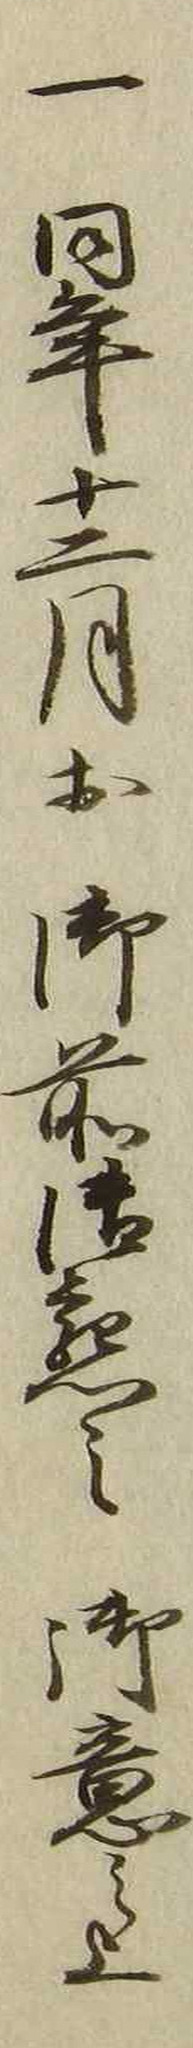一同年十二月お御前御懇之御意之上
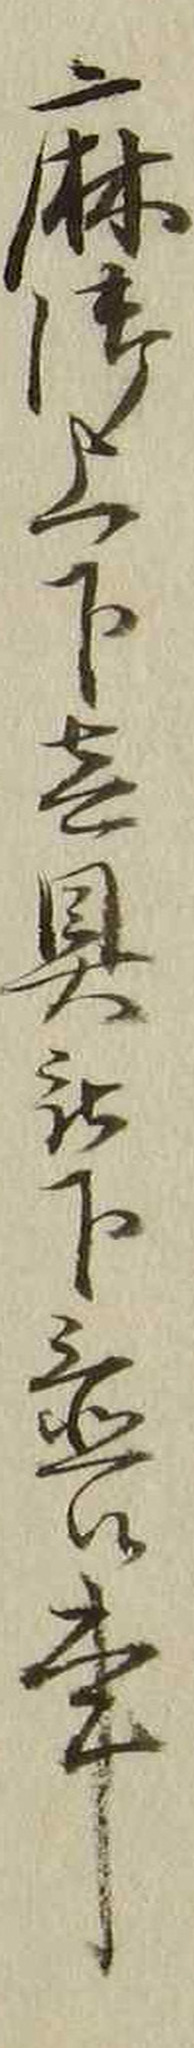麻御上下壱具被下置候事
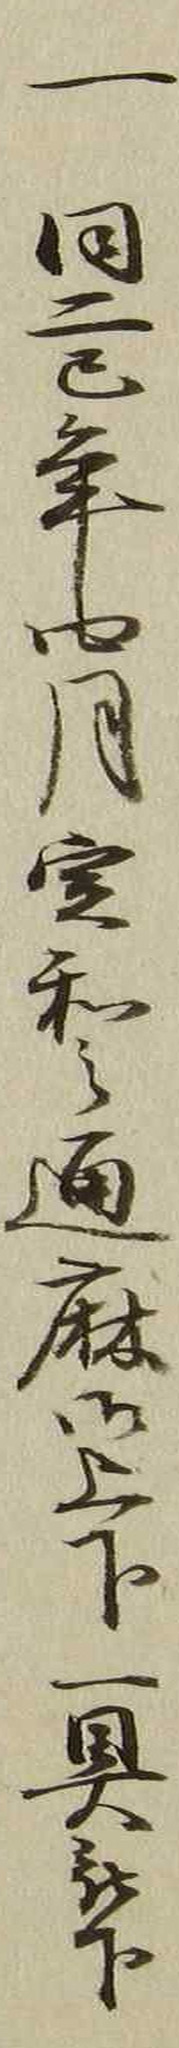一同ニ巳年四月定和之通麻御上下一具被下
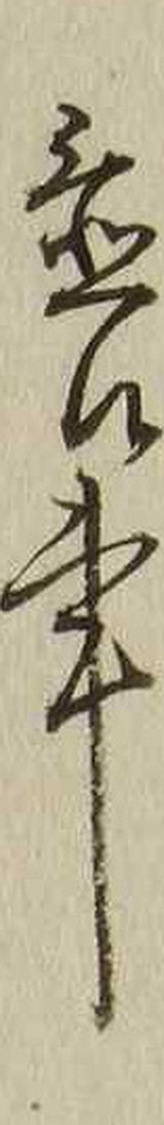置候事
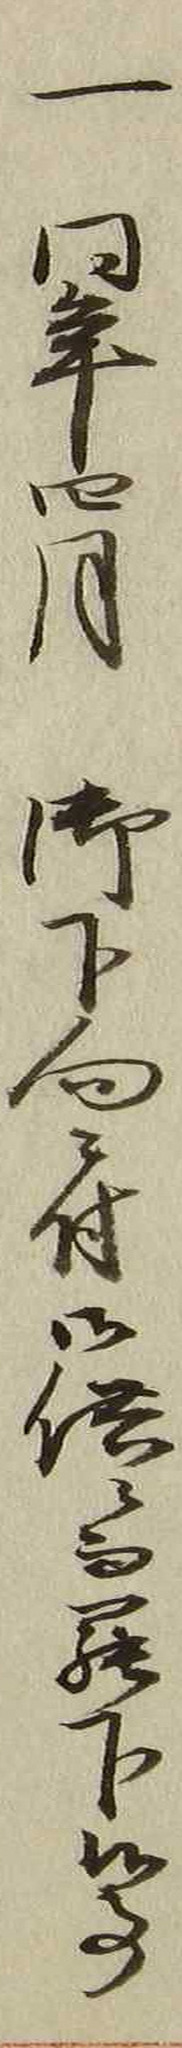一同年四月御下向ニ付御供ニ而罷下候事
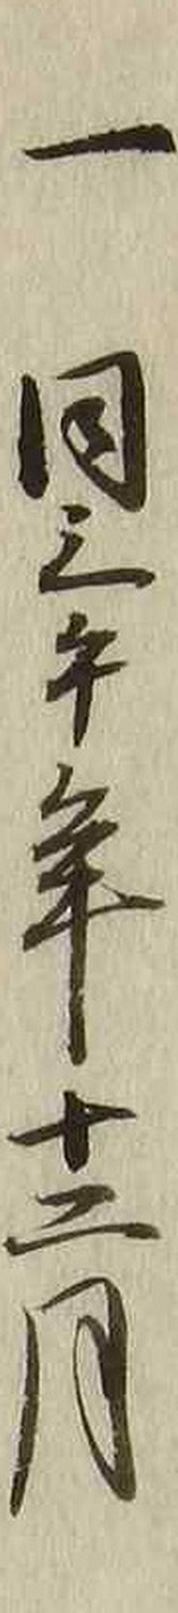一同三午年十二月
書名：諸士系譜　巻之114　か之部22
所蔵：会津若松市立会津図書館
